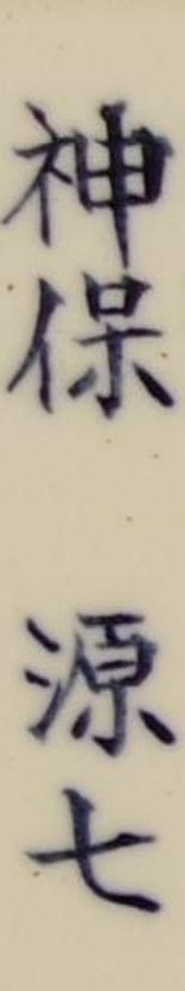神保源七
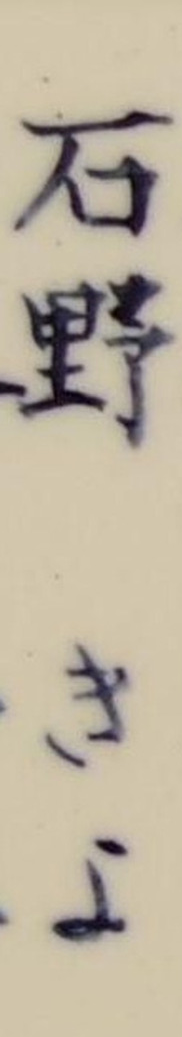石野きよ
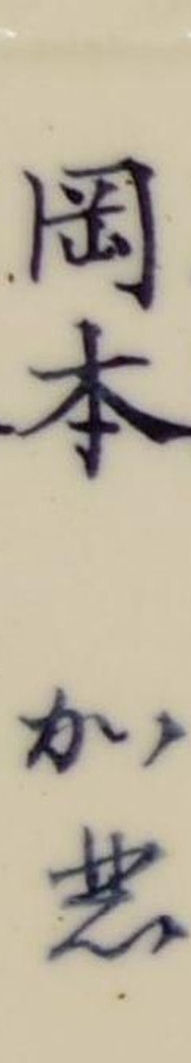岡本加の
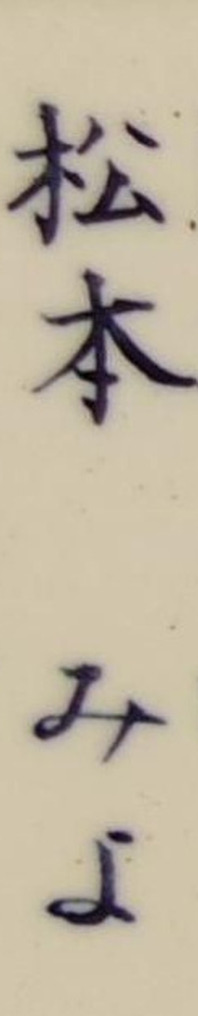松本みよ
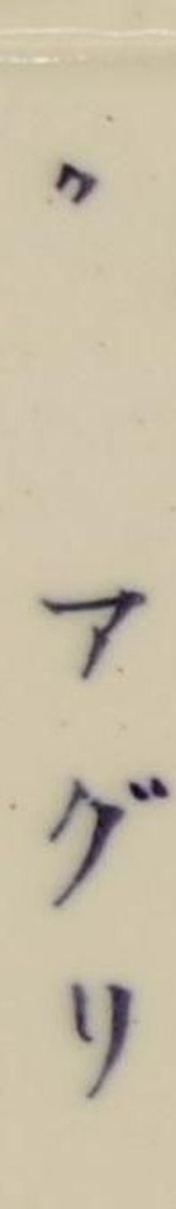アグリ
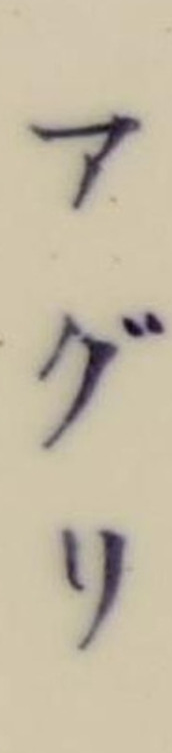アグリ

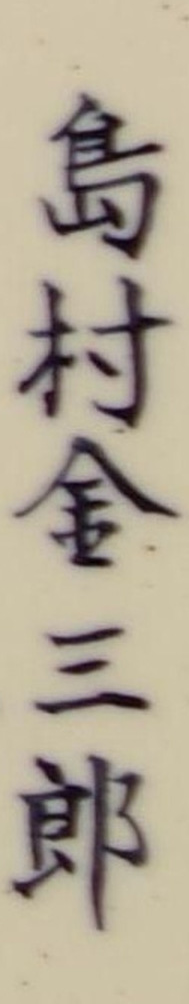島村金三郎
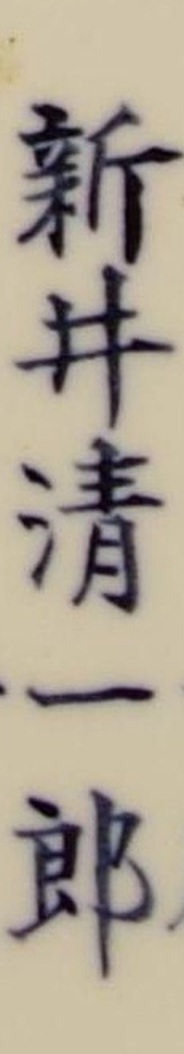新井清一郎
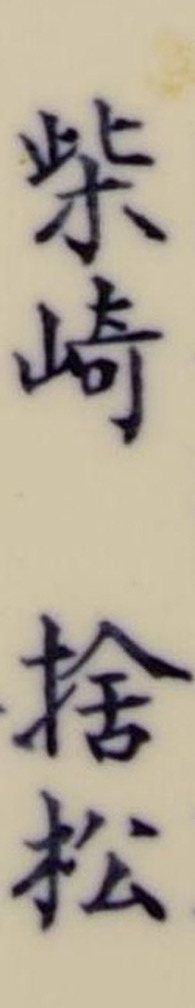柴崎捨松
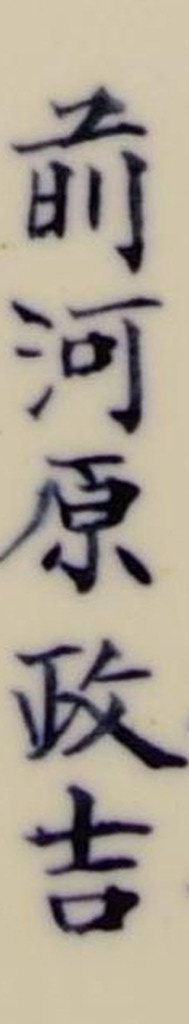前河原政吉
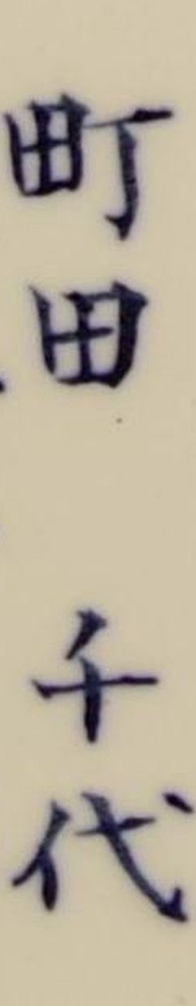町田千代
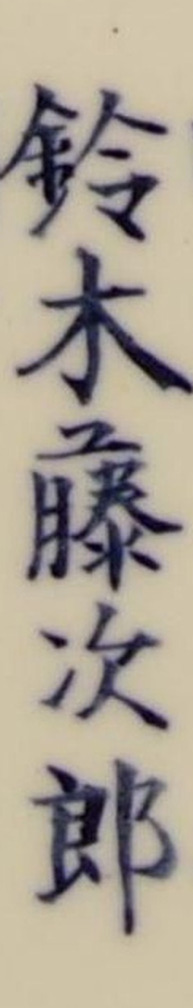鈴木藤次郎
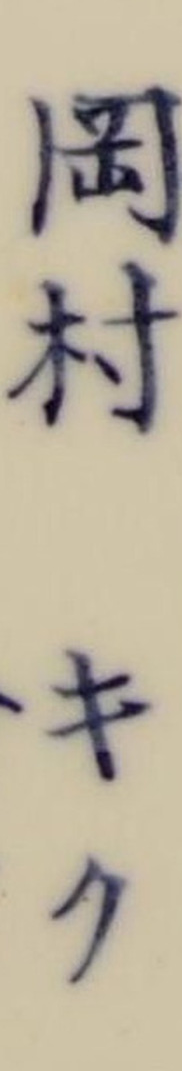岡村キク
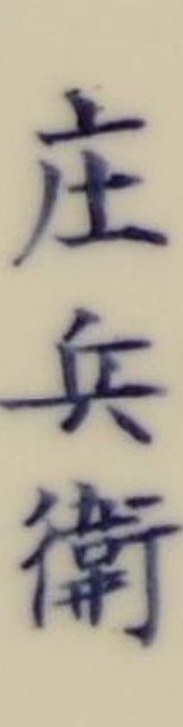庄兵衛
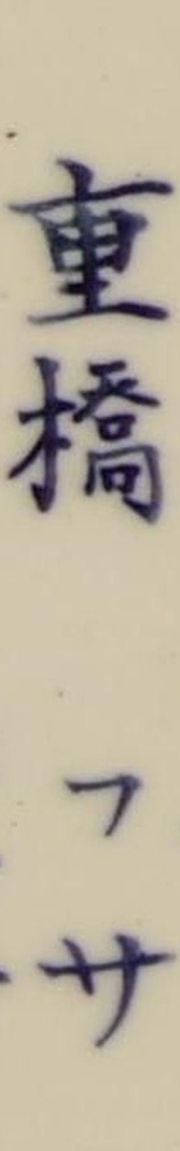重橋フサ
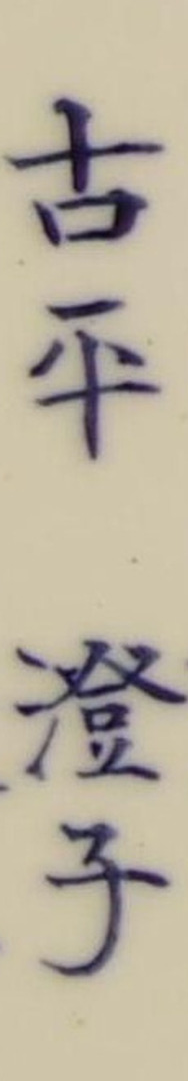古平澄子
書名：E~L
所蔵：高野山金剛峯寺
